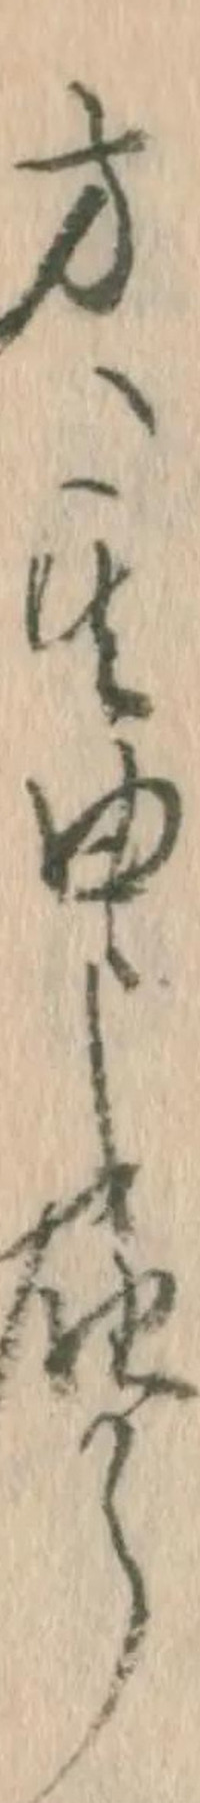方へ其由申届了
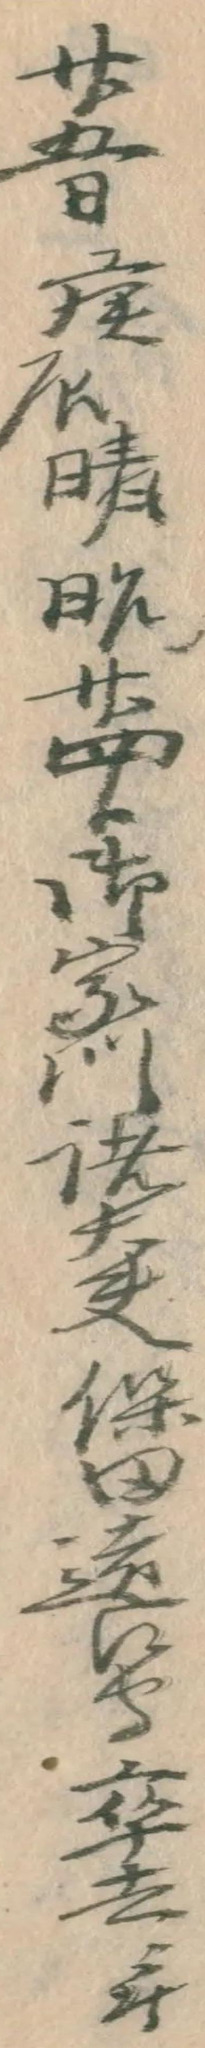廿五日庚辰晴昨廿四日御家門諸大夫保田遠江守卒去二付
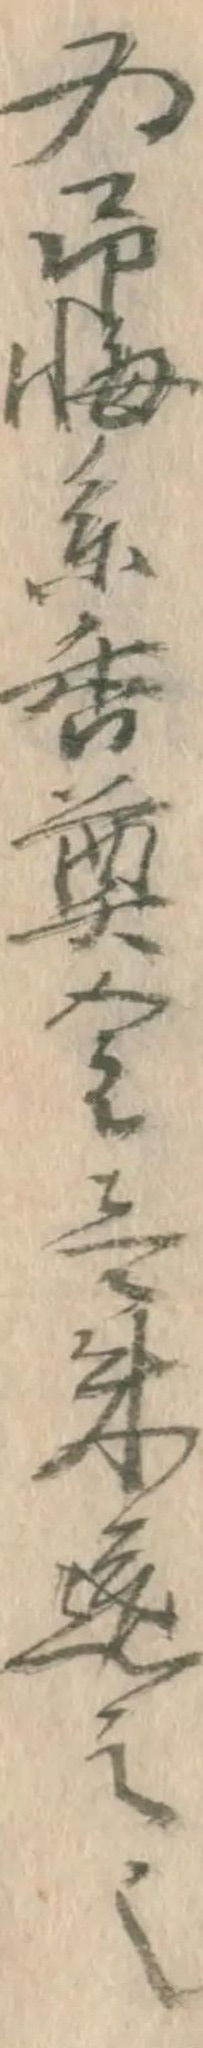為弔悔参香奠金壱朱送之也
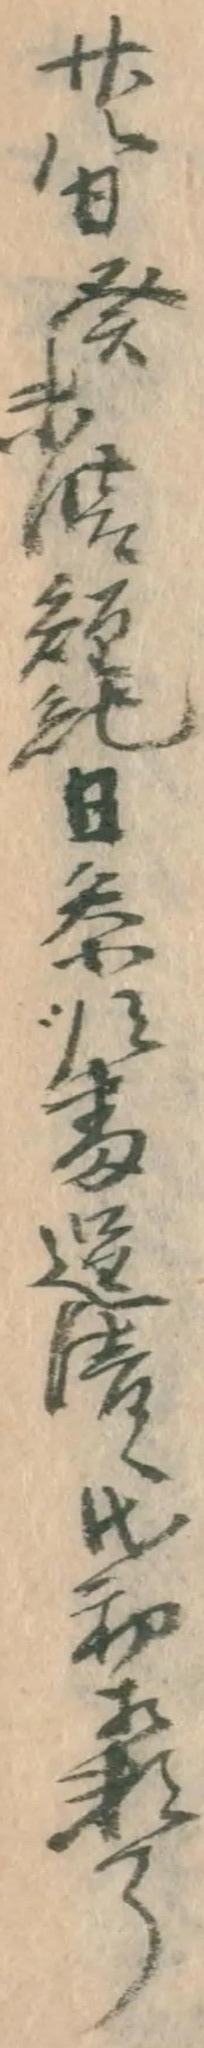廿八日癸未晴経紀日参順番逞清へ代勤相頼了

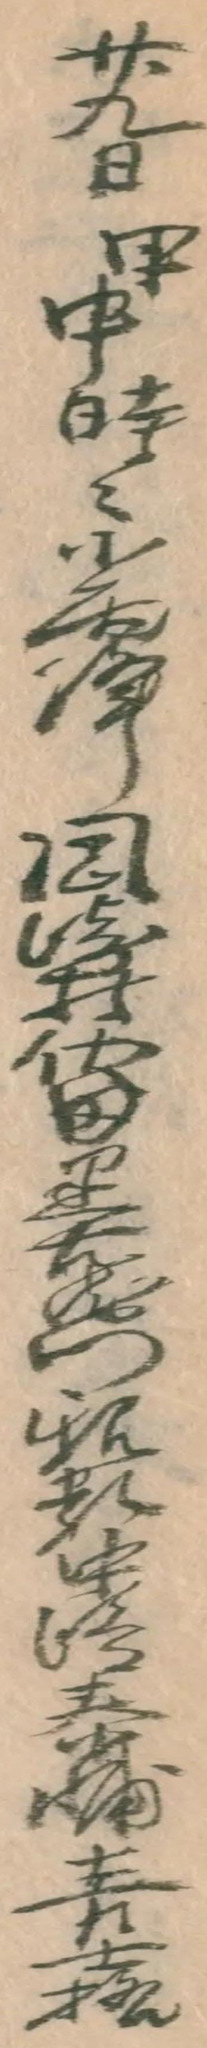廿九日甲申時々小雨降岡崎村伏田黒右衛門親類中嶋美小輔青士持候
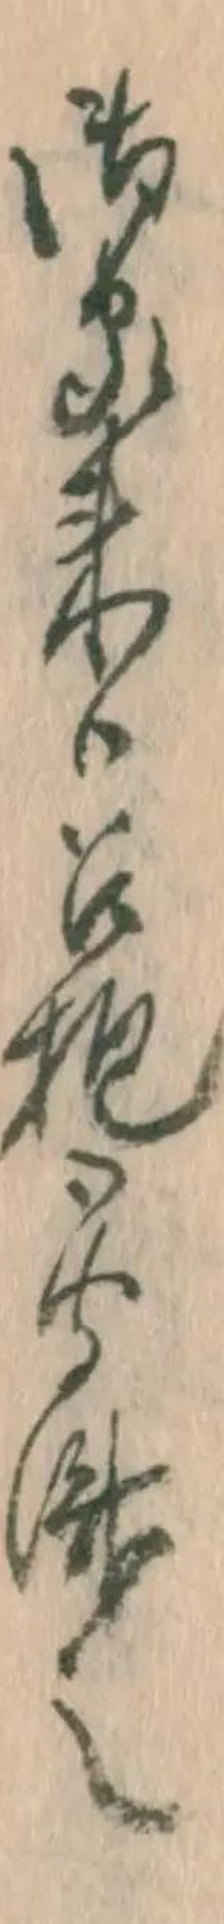御家来御召抱御聞済也
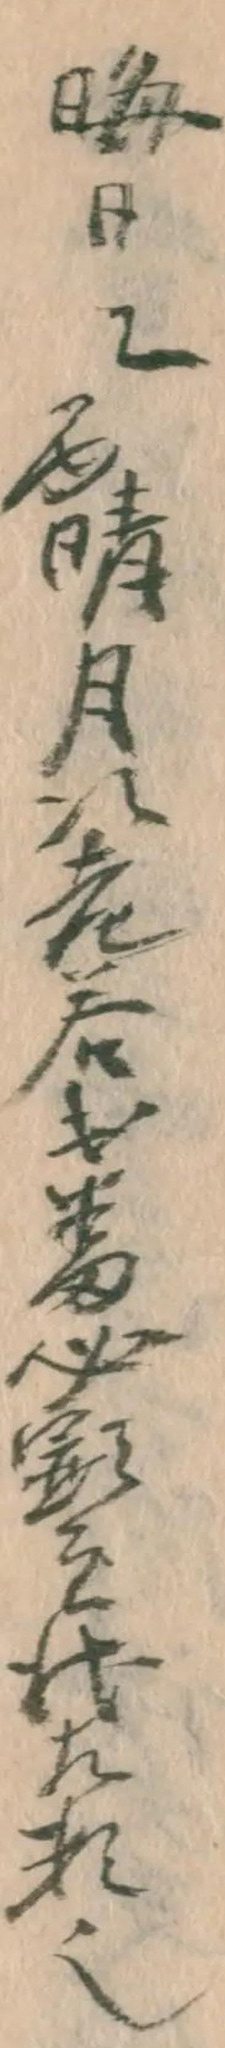晦日乙酉晴月次老若出番必顕之代相頼也
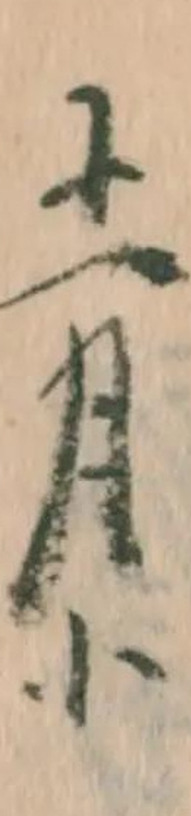十一月小
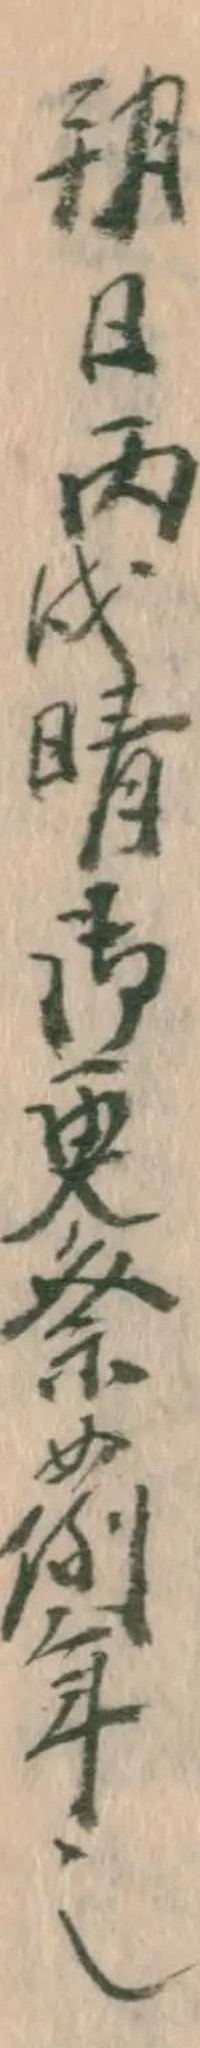朔日丙戌晴御更祭如例年也
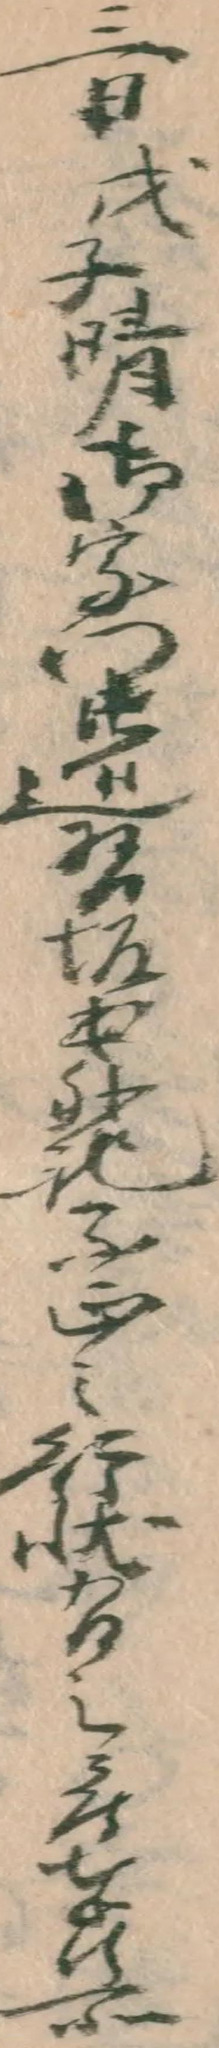三日戊子晴御家門御近習坂本外記不正之行状有之ニ付奉行所
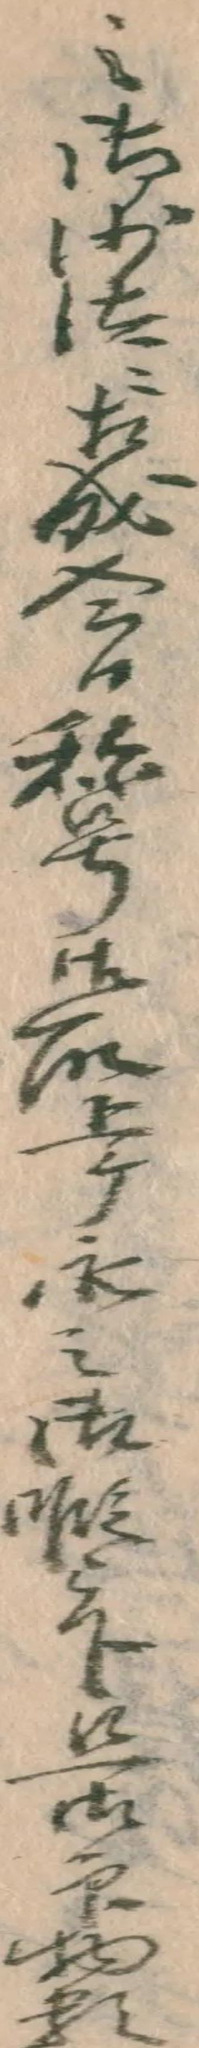之御沙汰ニ相成今日称号御取上ケ永之御暇被下且御印物類
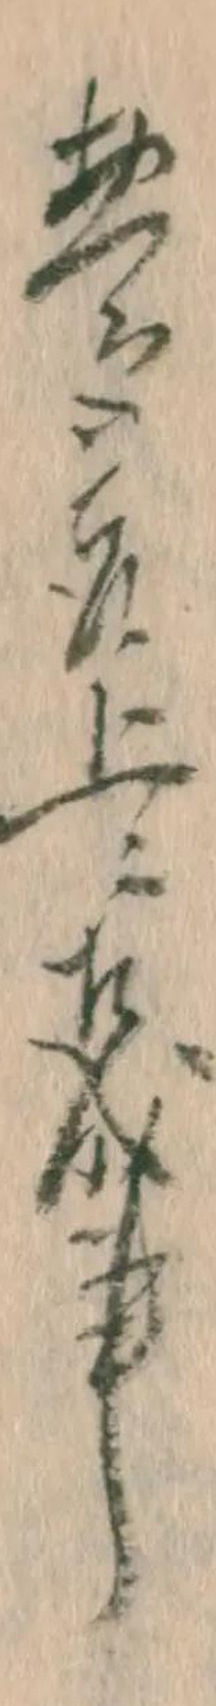惣而御取上ニ相成事
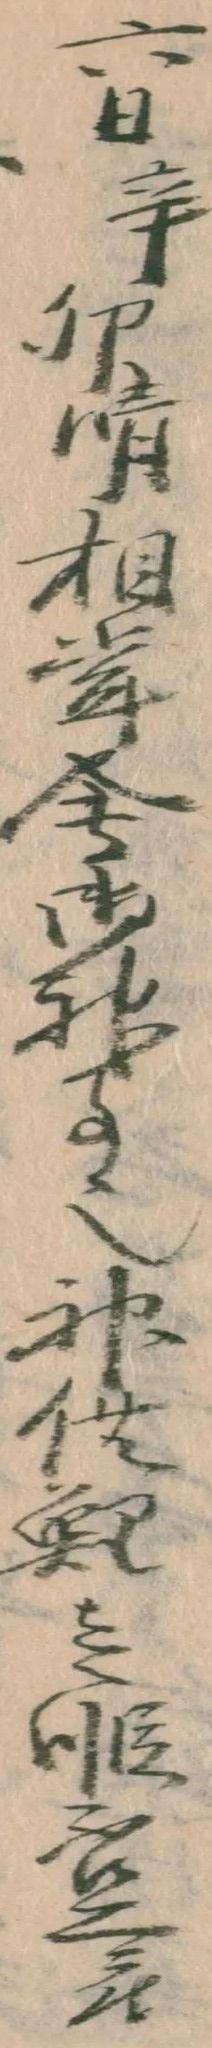六日辛卯晴相嘗會御神事也神供鯉一喉不足ニ付
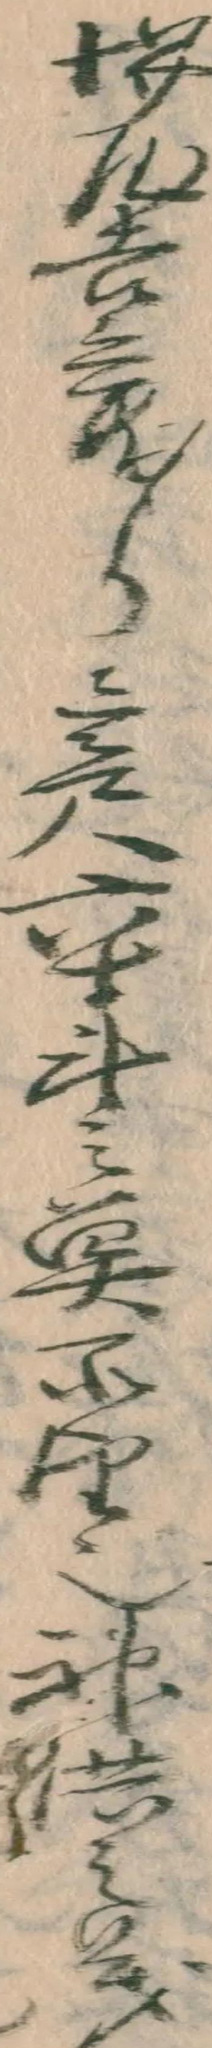堺屋吉兵蔵より壱尺六寸斗之魚所望也神供之義
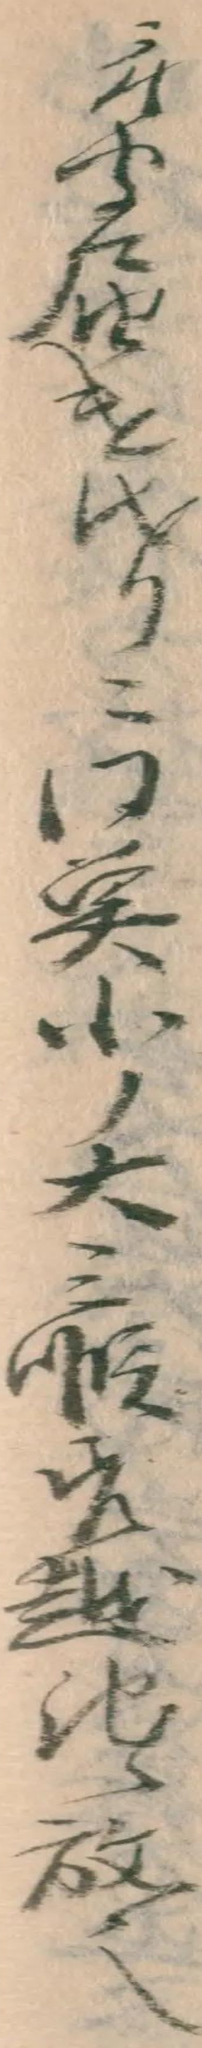ニ付聞届遣代りニ同魚小ノ大三喉差越池へ放也
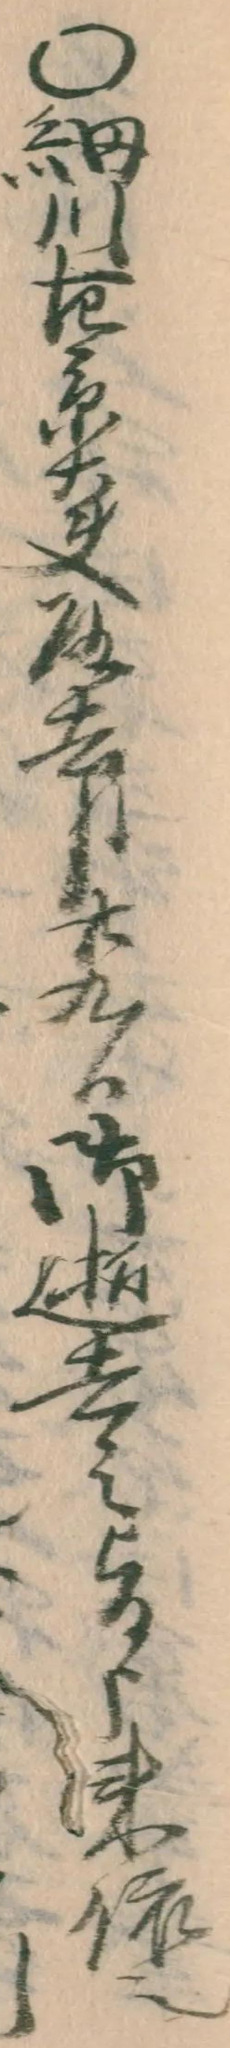○細川左京大夫殿去月廿九日御逝去之旨申来依之
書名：賀茂社記録. 第67冊
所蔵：国立国会図書館 National Diet Library, JAPAN
